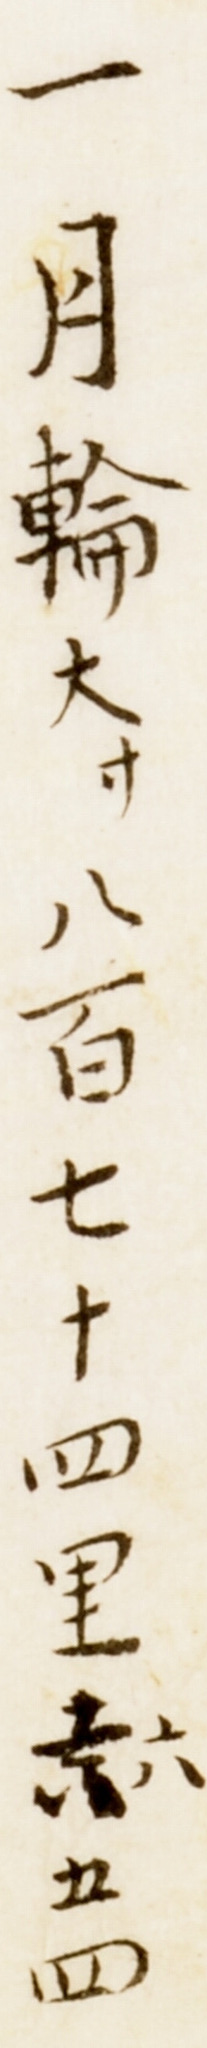一月輪大サ八百七十四里六五四
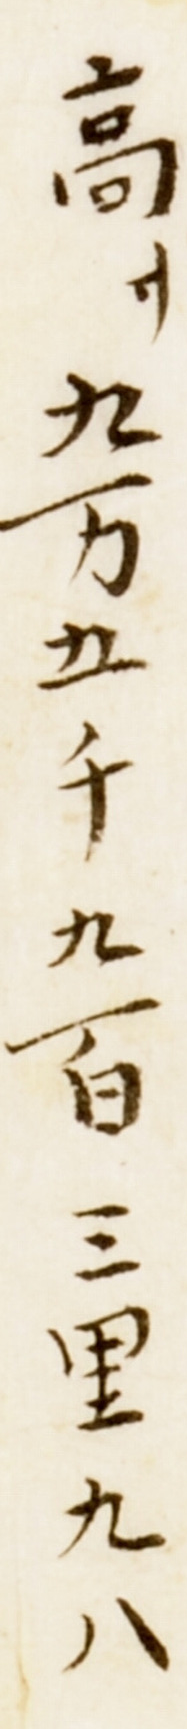高サ九万五千九百三里九八
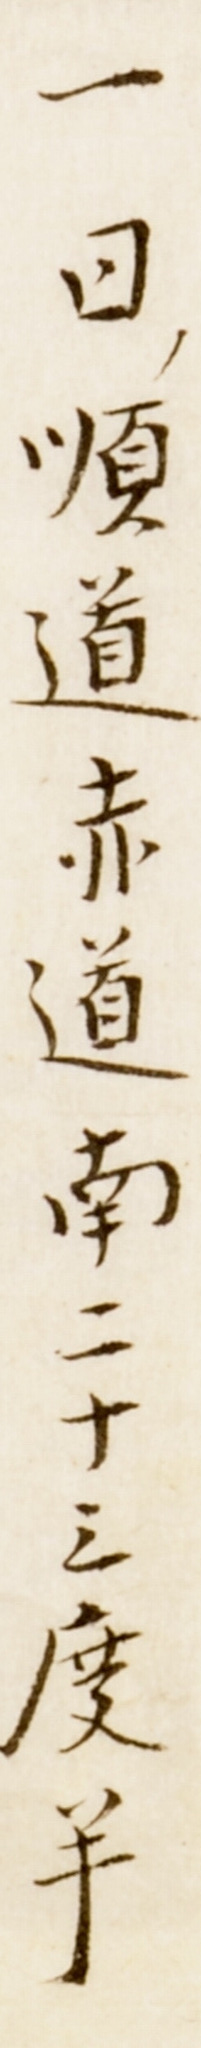一日ノ順道赤道南二十三度半
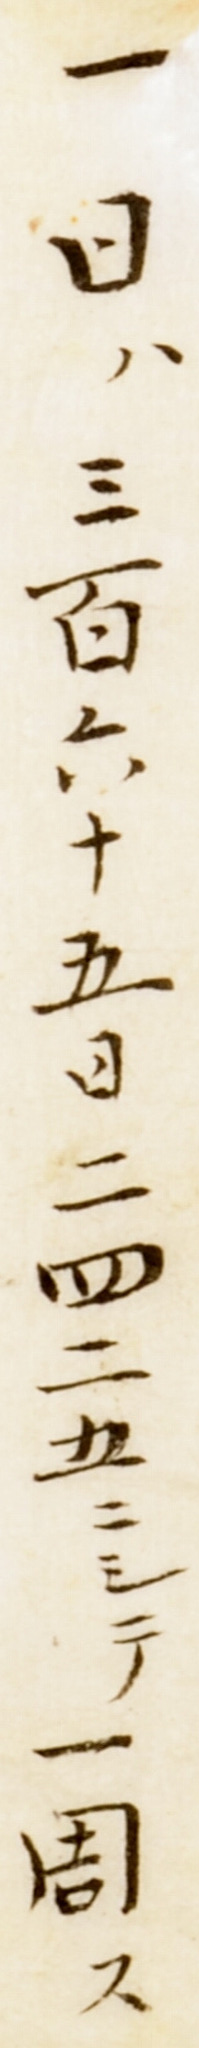一日ハ三百六十五日二四二五ニシテ一周ス
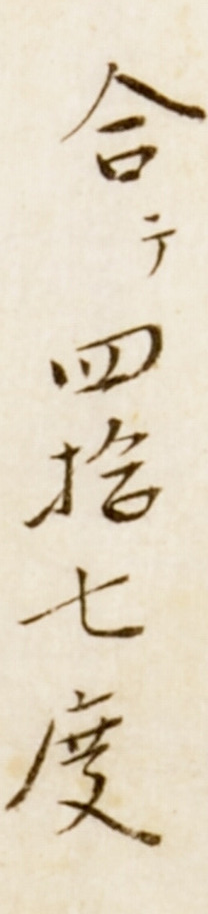合テ四拾七度
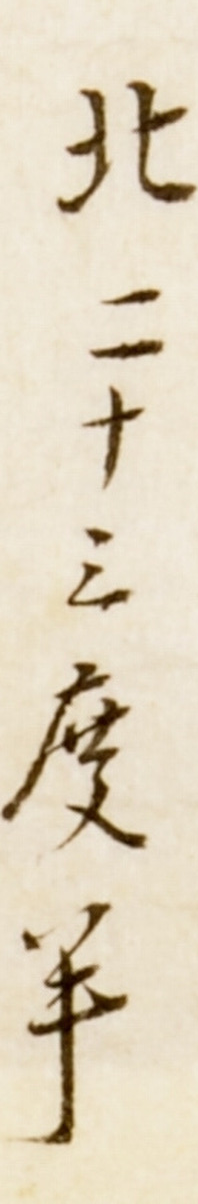北二十三度半
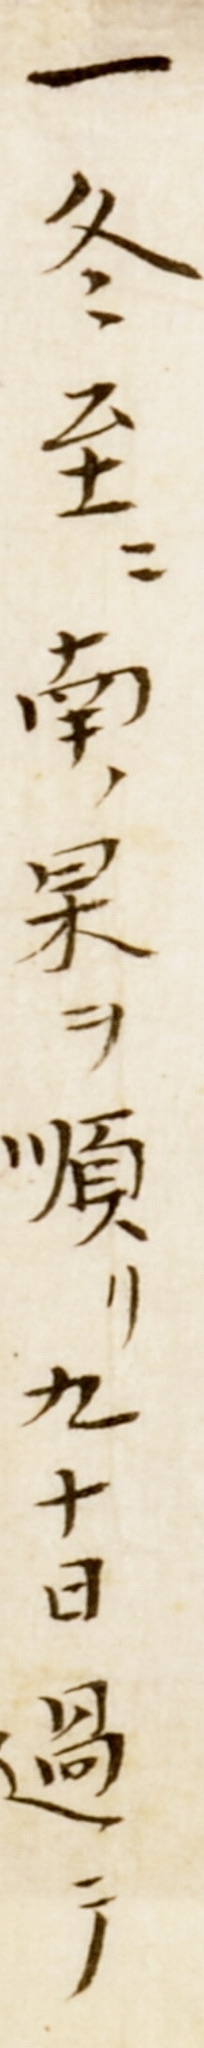一冬至ニ南ノ果ヲ順リ九十日過テ
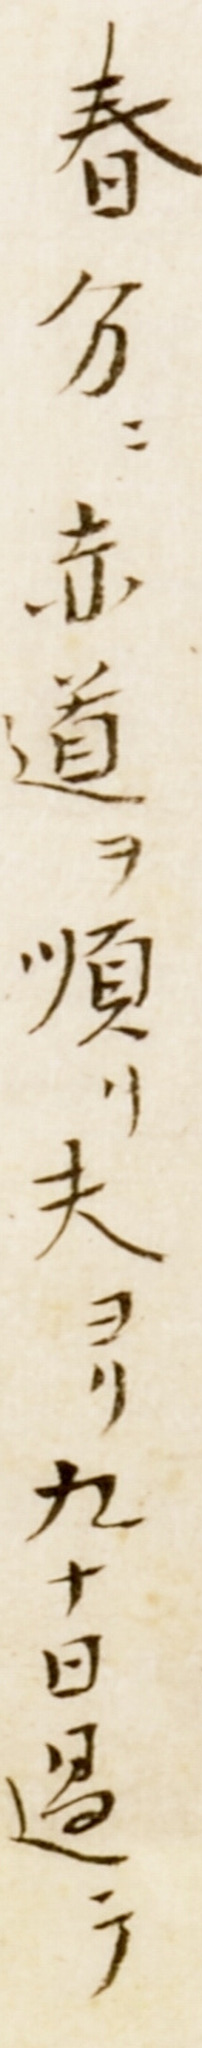春分ニ赤道ヲ順リ夫ヨリ九十日過テ
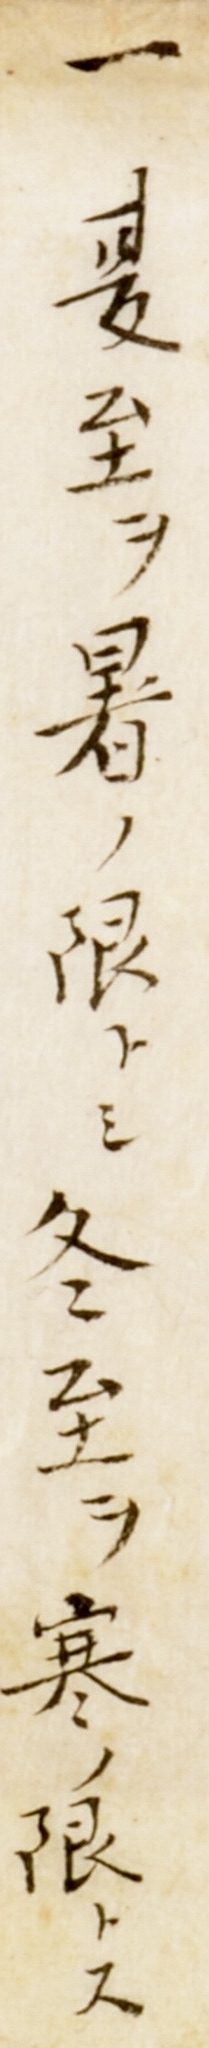一夏至ヲ暑ノ限トシ冬至ヲ寒ノ限トス
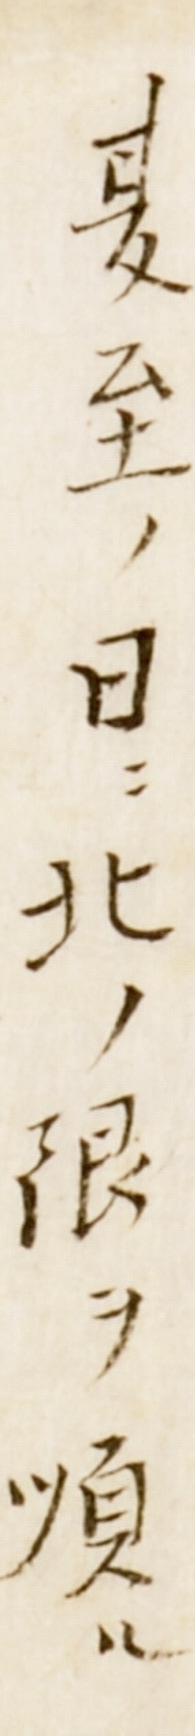夏至ノ日ニ北ノ限りヲ順ル
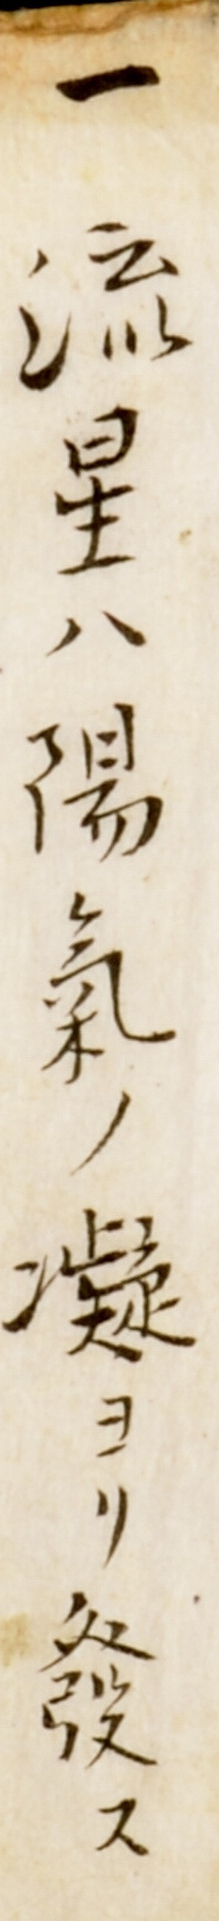一流星ハ陽氣ノ凝ヨリ発ス
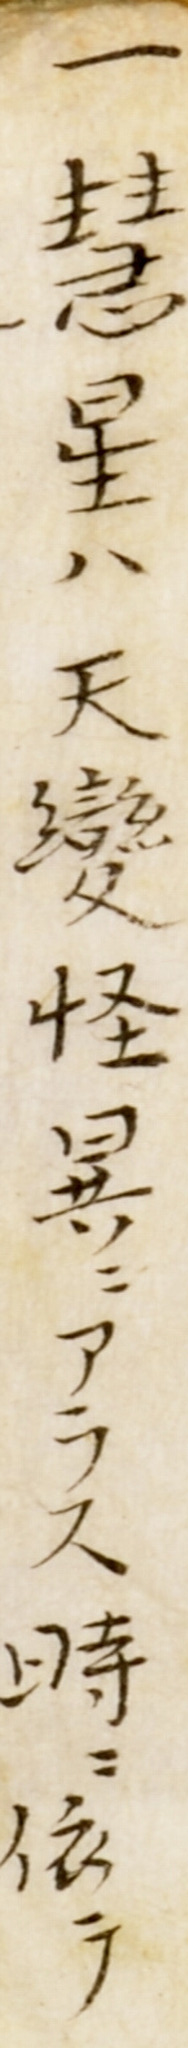一彗星ハ天変怪異ニアラス時ニ依テ

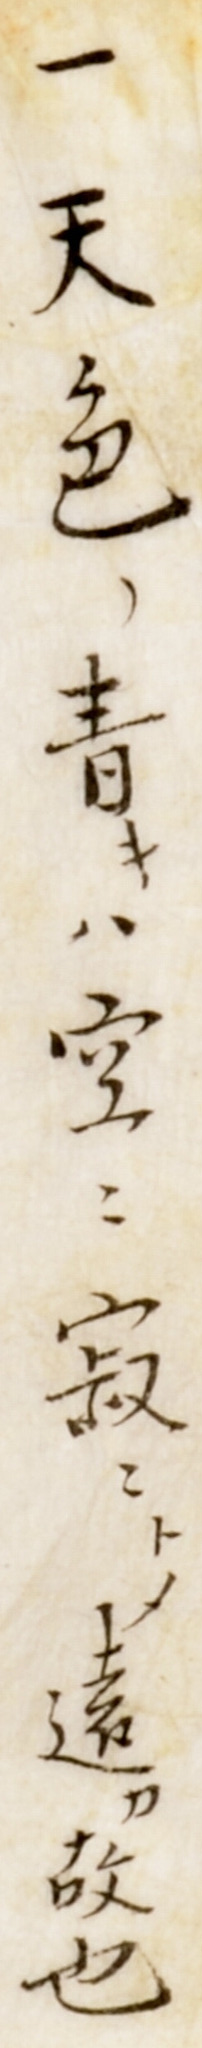一天色ノ青キハ空ニ寂々トシテ遠カ故也
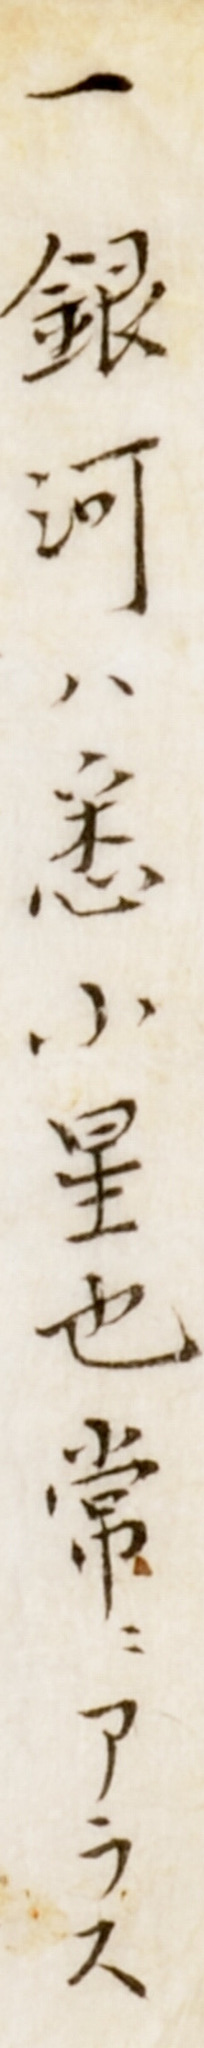一銀河ハ悉小星也常ニアラス
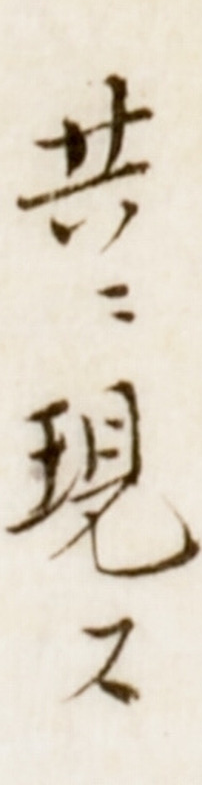共ニ現ス
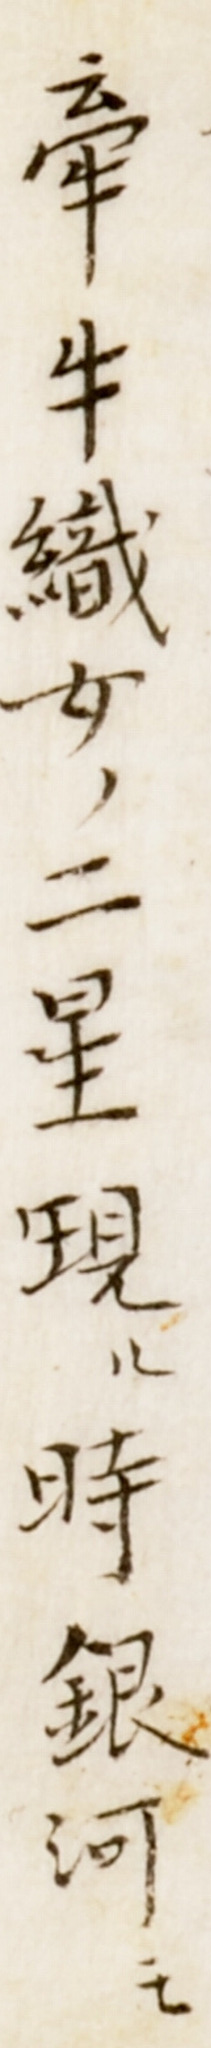牽牛織女ノ二星現ル時銀河モ
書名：御測量覚書
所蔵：伊那市立高遠町図書館・合同会社AMANE
